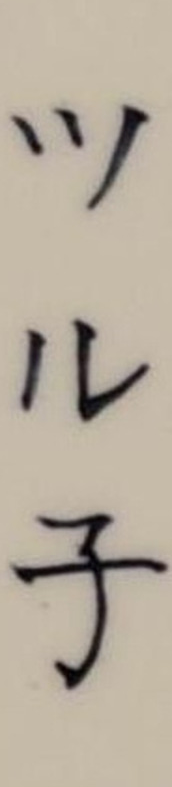ツル子
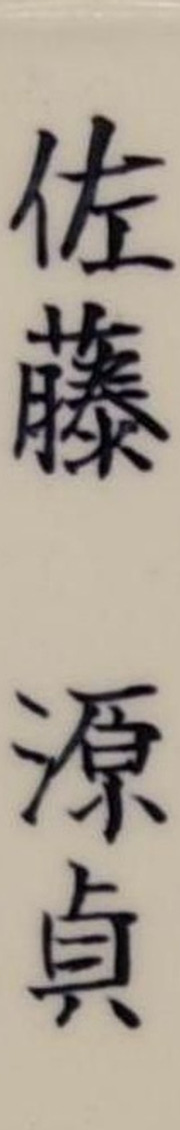佐藤源貞
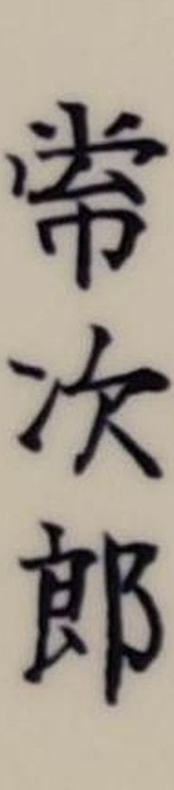常次郎
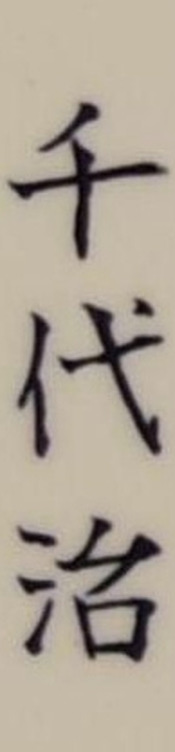千代治
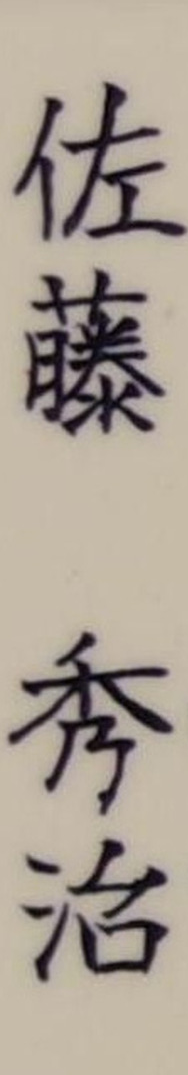佐藤秀治
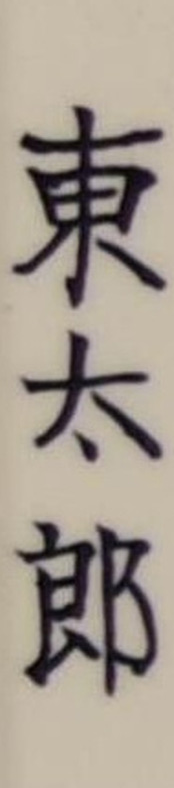東太郎

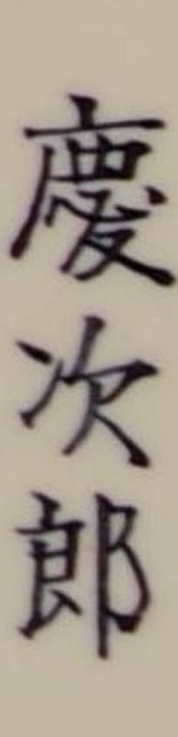慶次郎
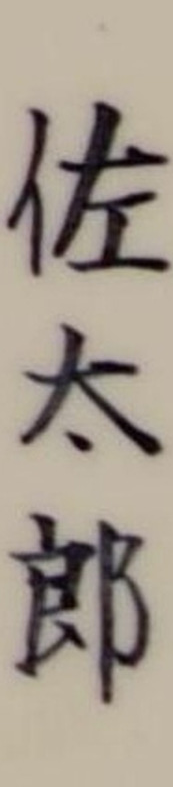佐太郎
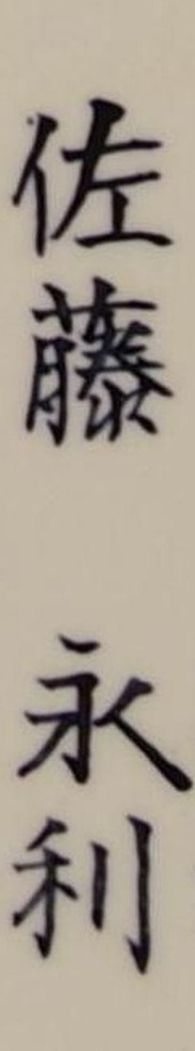佐藤永利
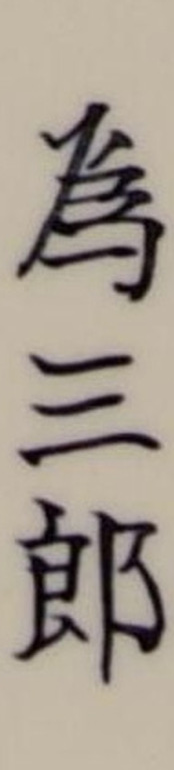為三郎
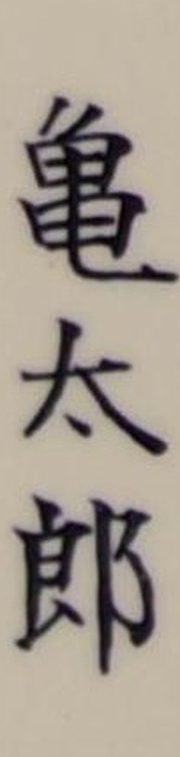亀太郎

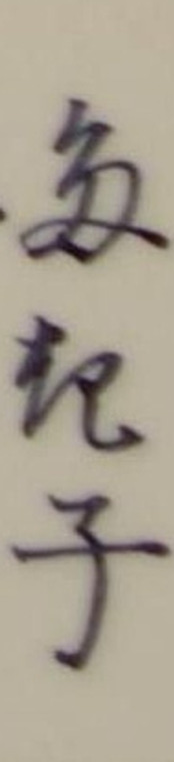たき子
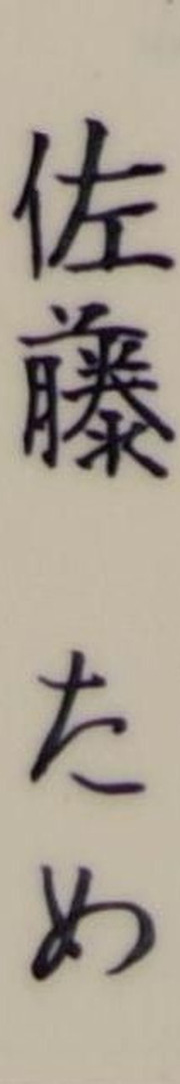佐藤ため
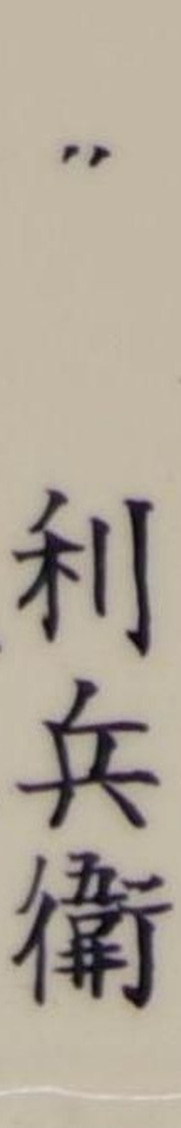利兵衛
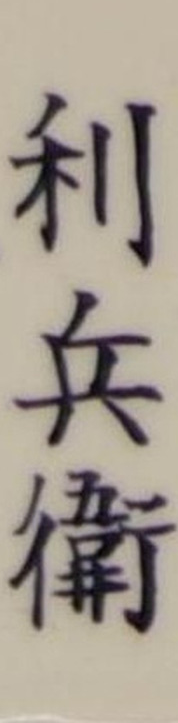利兵衛
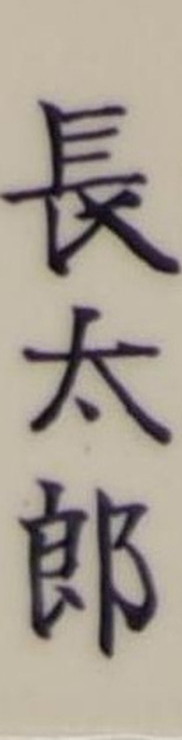長太郎
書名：E~L
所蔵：高野山金剛峯寺
